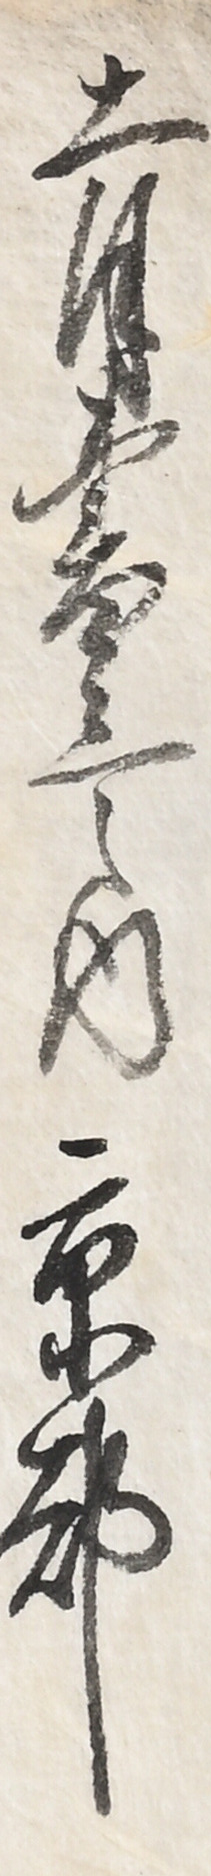十一月書上之内京都
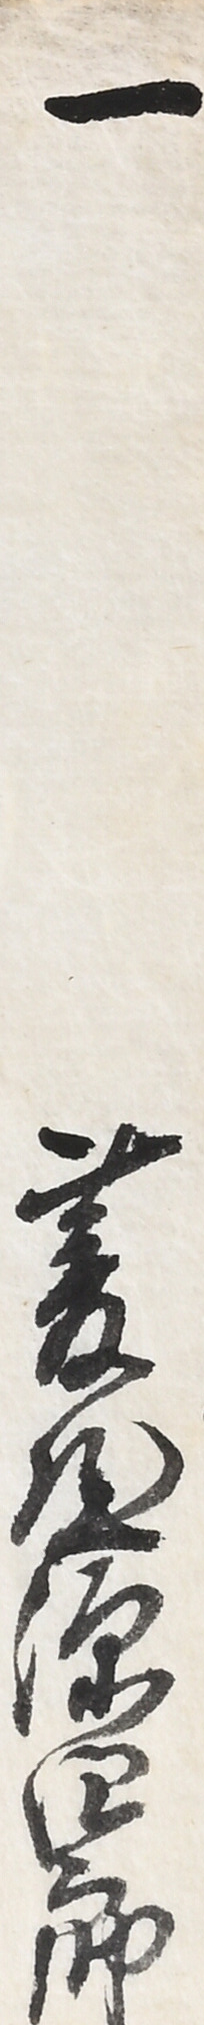一菱屋源四郎
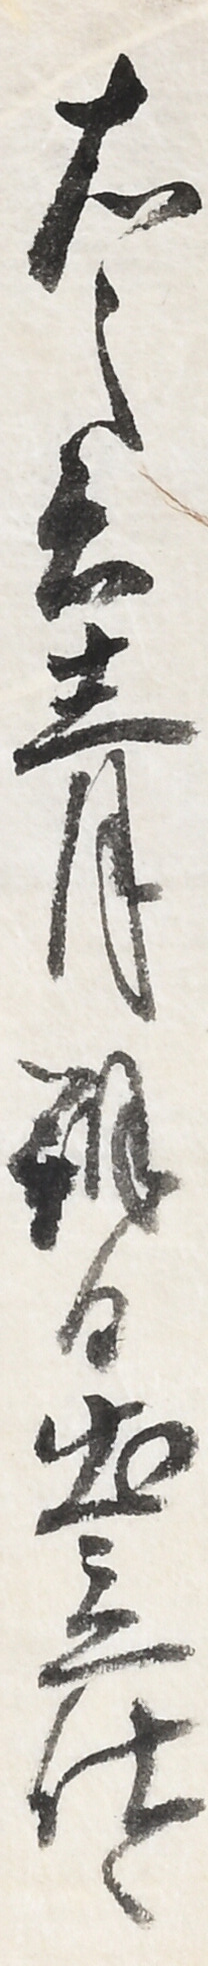右之者十二月朔日出立仕候
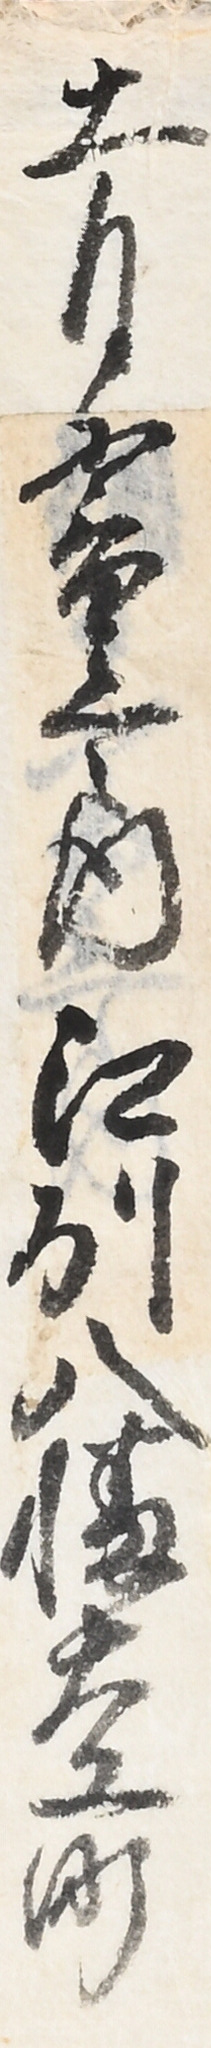十一月書上之内江州八幡大工町
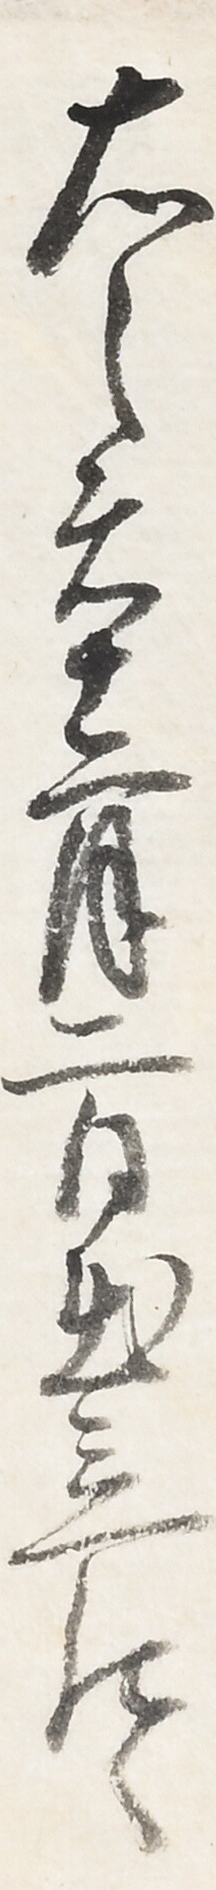右之者十二月二日出立仕候
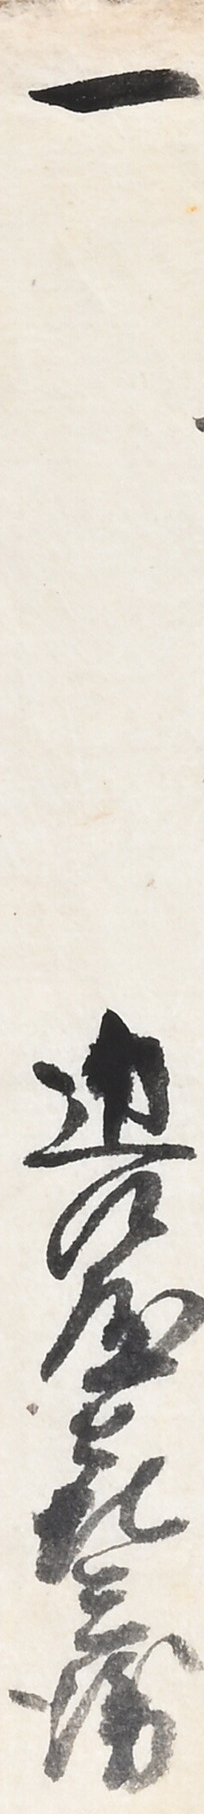一近江屋喜兵衛
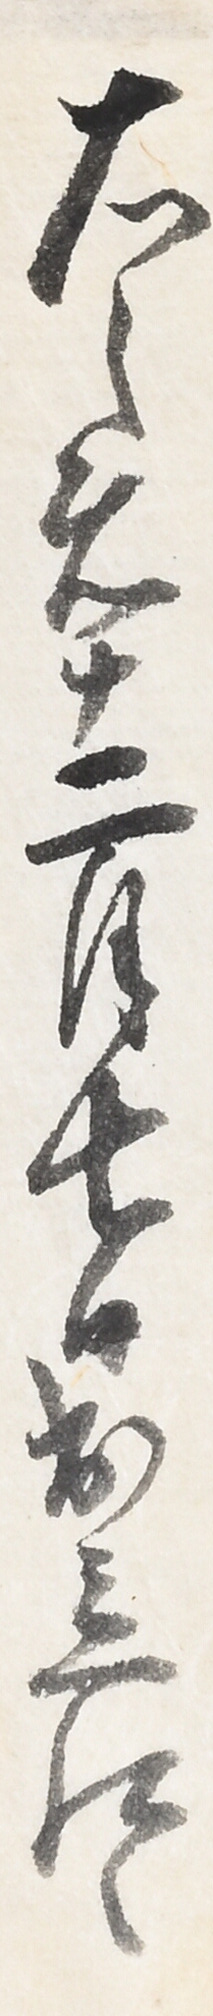右之者十二月七日出立仕候
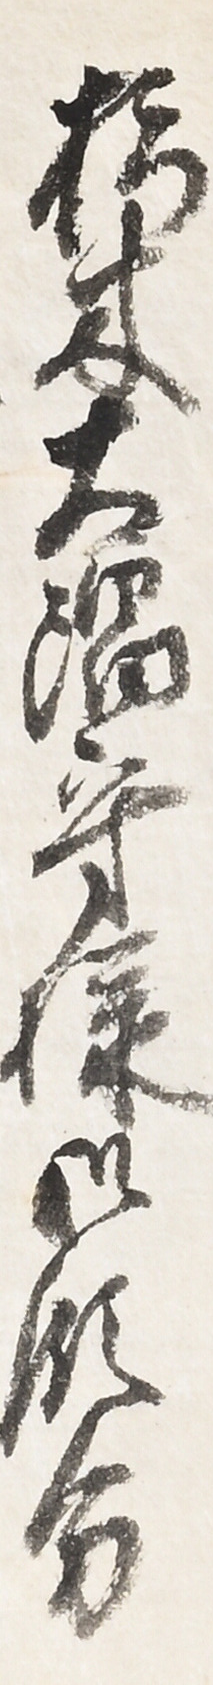朽木大隅守様御領分
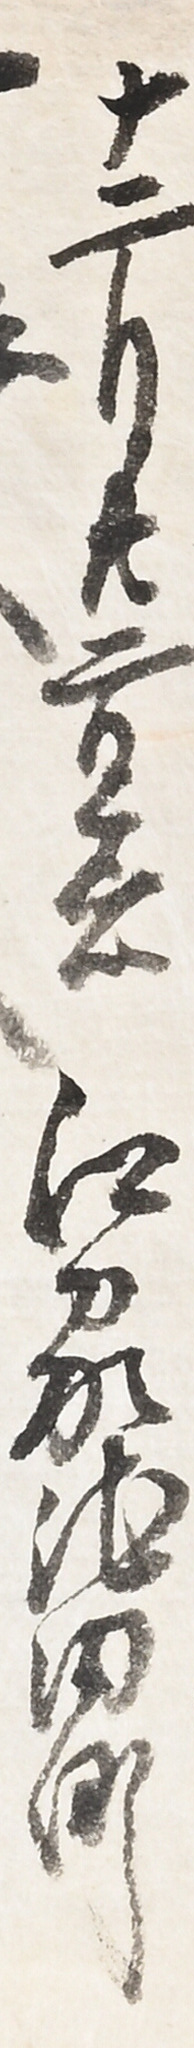十二月廿二日着江州池田町
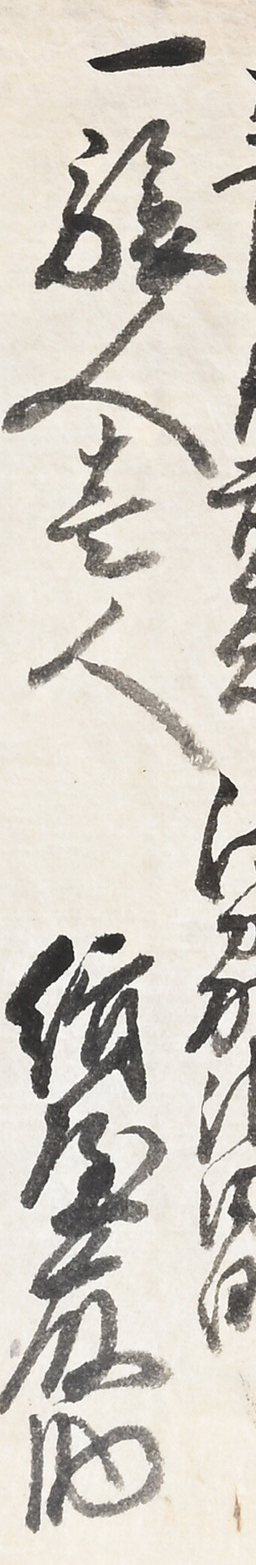一旅人壱人絹屋藤助
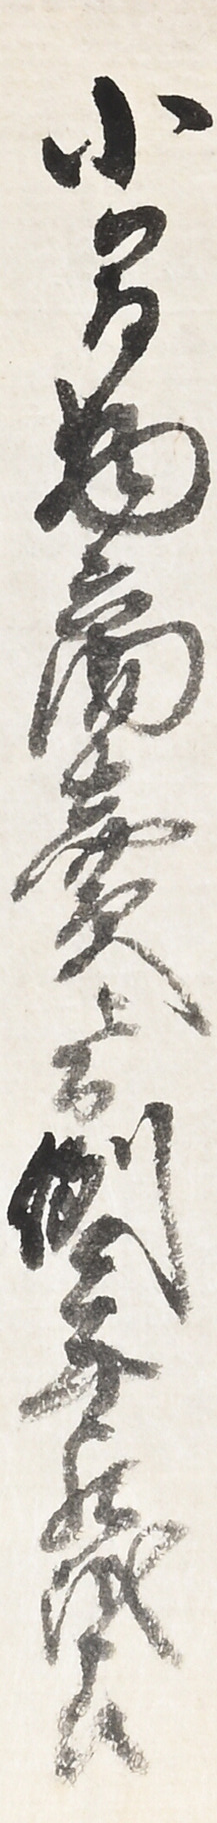小間物商売ニ而例年罷越申候
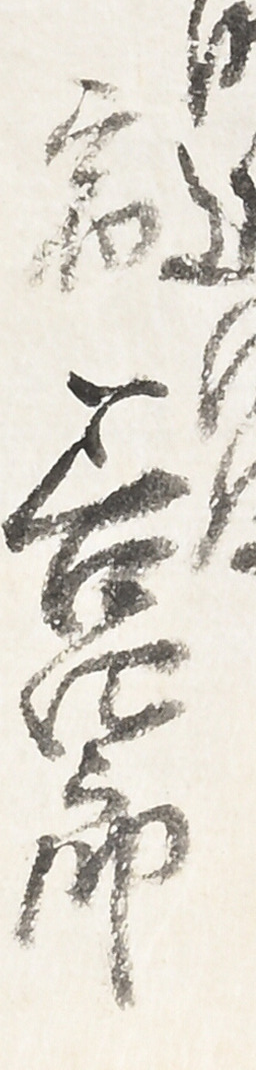宿善四郎
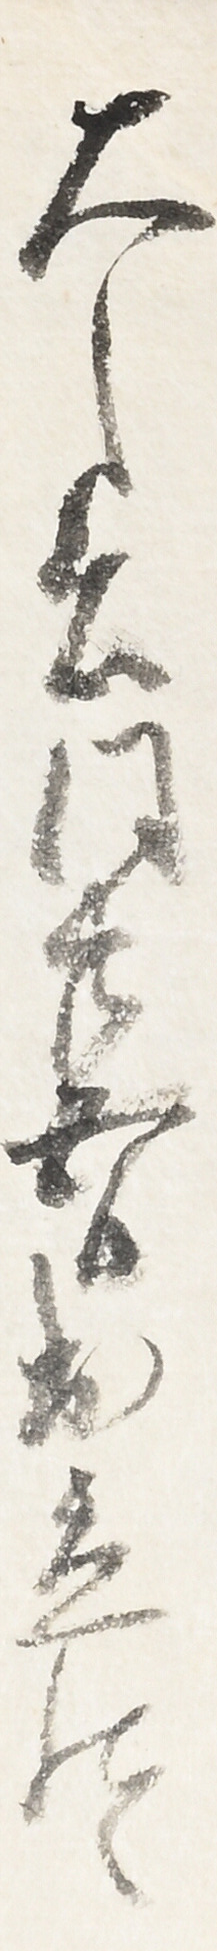右之者同廿五日出立仕候
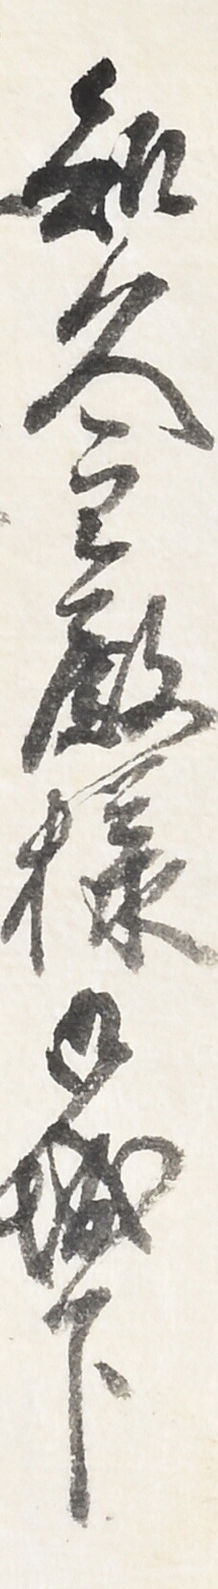知久主殿様御城下
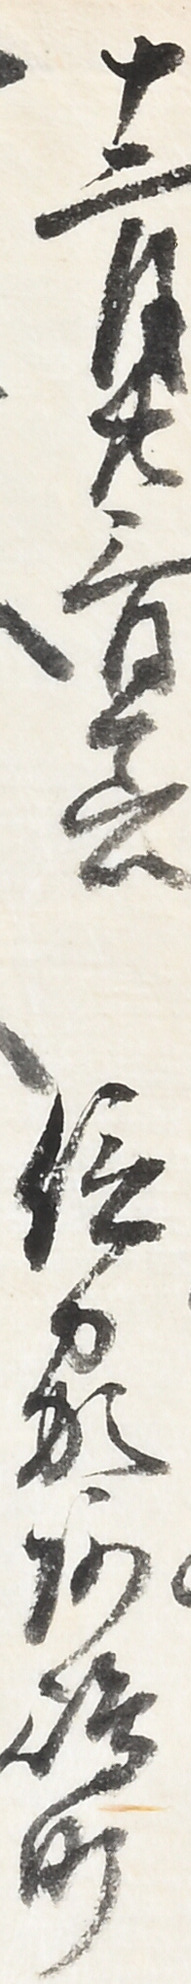十二月廿三日着信州阿嶋町
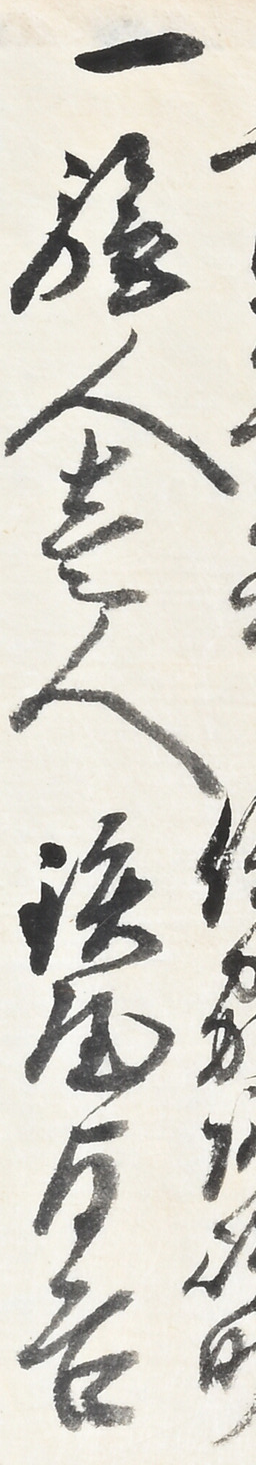一旅人壱人鉄屋与吉
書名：旅人泊控帳
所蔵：伊那市立高遠町図書館・合同会社AMANE
